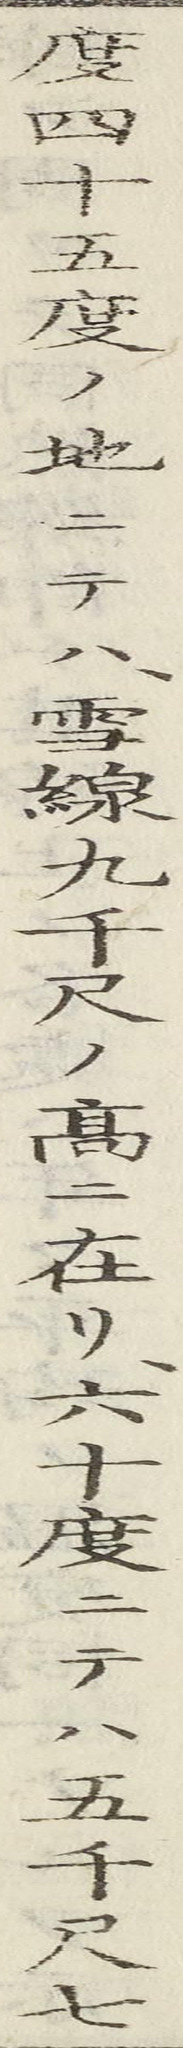度四十五度ノ地ニテハ、雪線九千尺ノ高ニ在リ、六十度ニテハ五千尺七
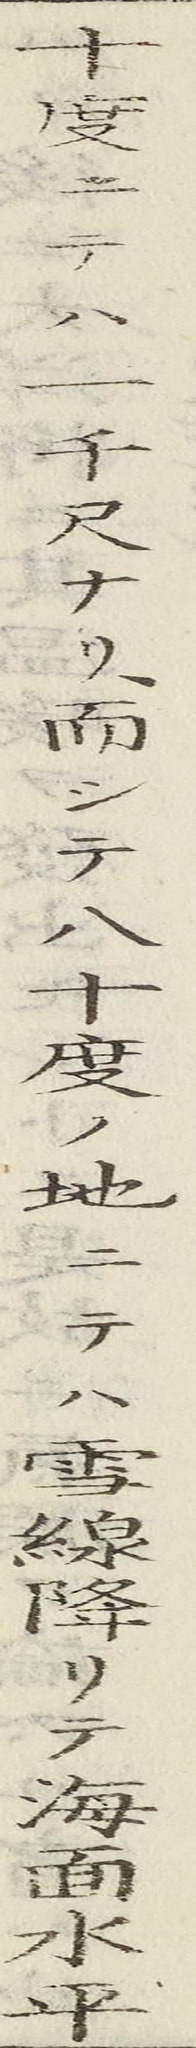十度にては一千尺ナリ、而シテ八十度ノ地ニテハ雪線降リテ海面水平
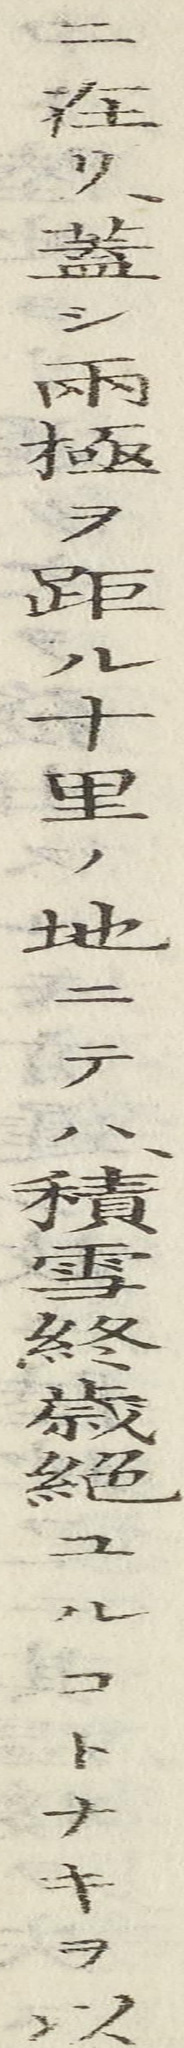ニ在リ、蓋シ両極ヲ距ル十里ノ地ニテハ、積雪終歳絶ユルコトナキヲ以
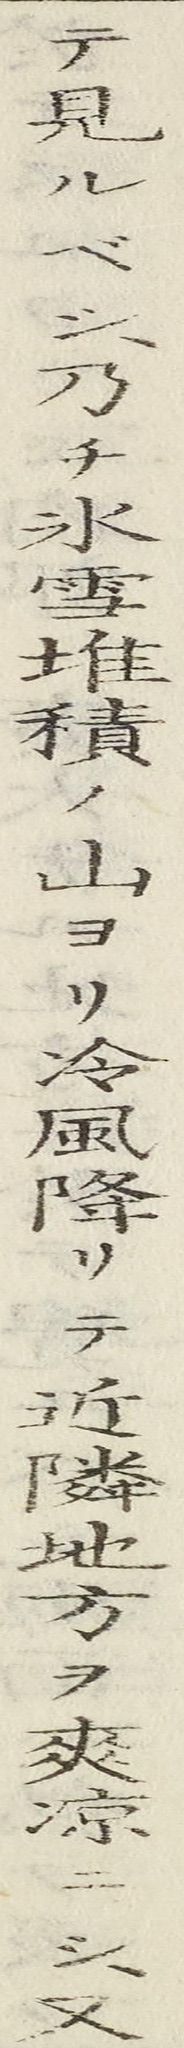テ見ルベシ、乃チ氷雪堆積ノ山ヨリ冷風降リテ近隣地方ヲ爽涼ニシ、又
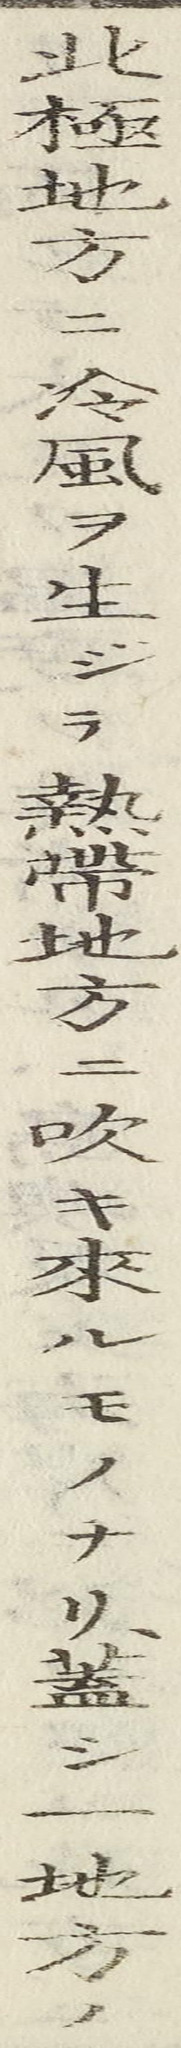北極地方ニ冷風ヲ生ジテ熱帯地方ニ吹キ来ルモノナリ、蓋シ一地方ノ
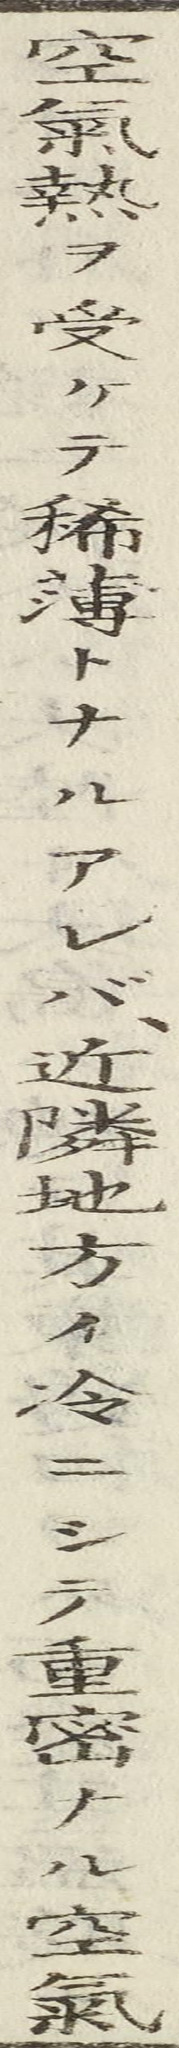空気熱ヲ受ケテ稀薄トナルアレバ、近隣地方ノ冷ニシテ重密ナル空気
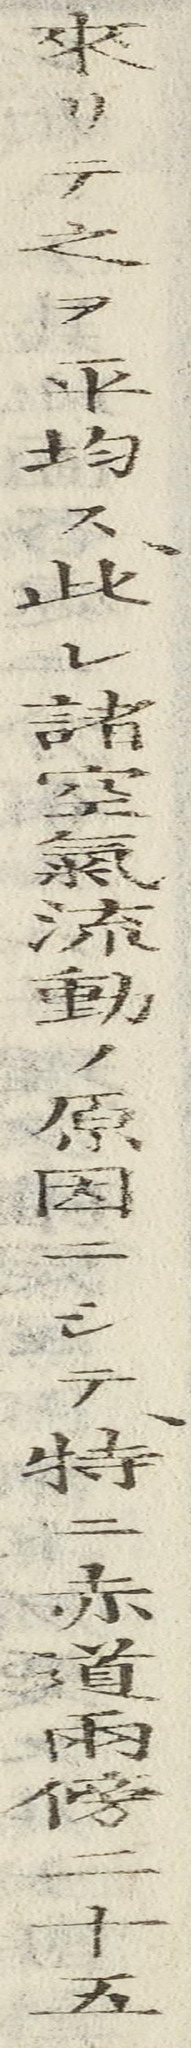来リテ之ヲ平均ス、此レ諸空気流動ノ原因ニシテ、特ニ赤道両傍二十五
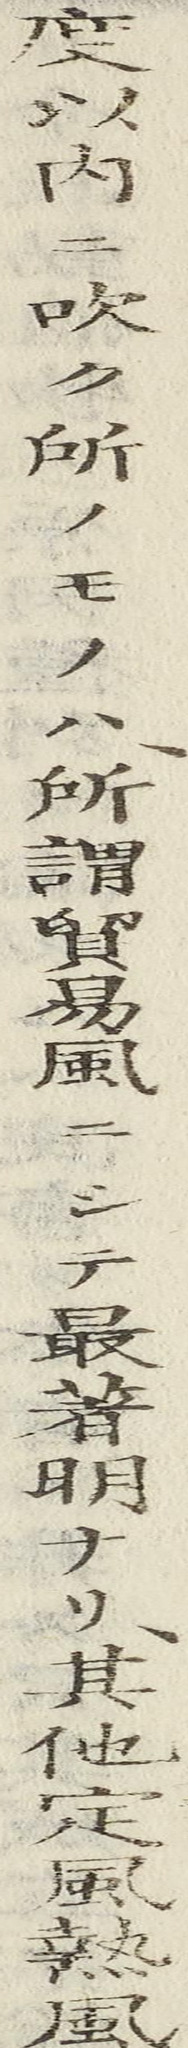度以内ニ吹ク所ノモノハ、所謂貿易風ニシテ最著明ナリ、其他定風熱風
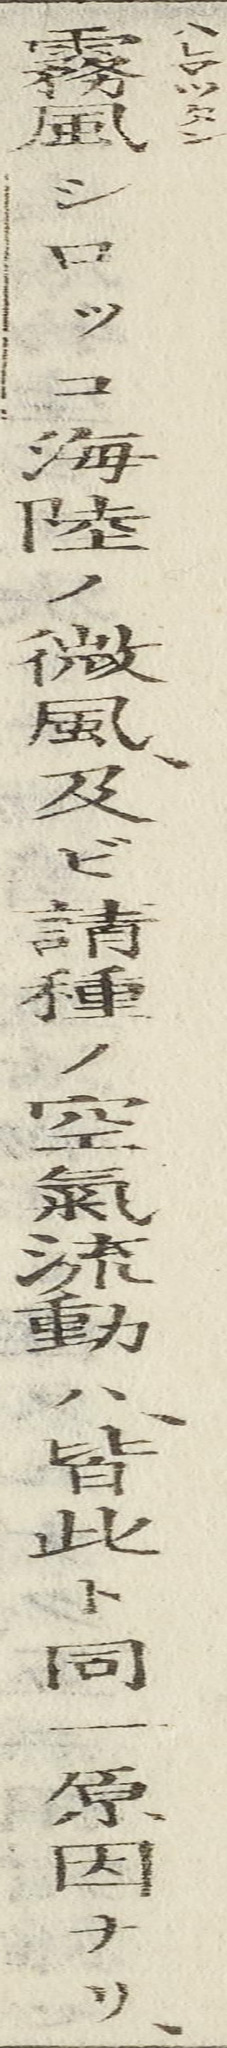霧風シロッコ海陸ノ微風、及ビ諸種ノ空気流動ハ、皆此ト同一原因ナリ、
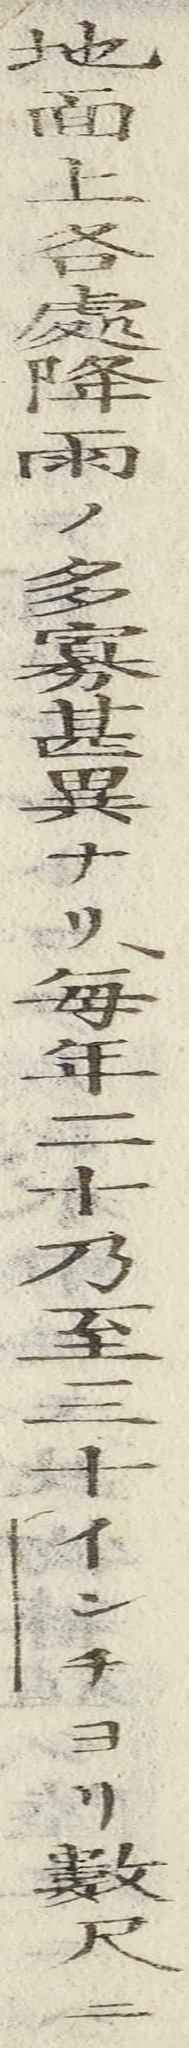地面上各処降雨ノ多寡甚異ナリ、毎年二十乃至三十インチヨリ数尺ニ
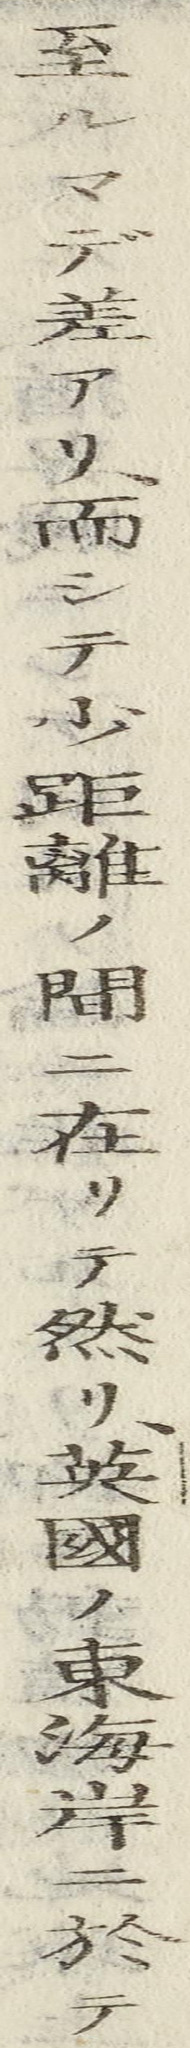至ルマデ差アリ、而シテ少距離ノ間ニ在リテ然リ、英国ノ東海岸ニ於テ
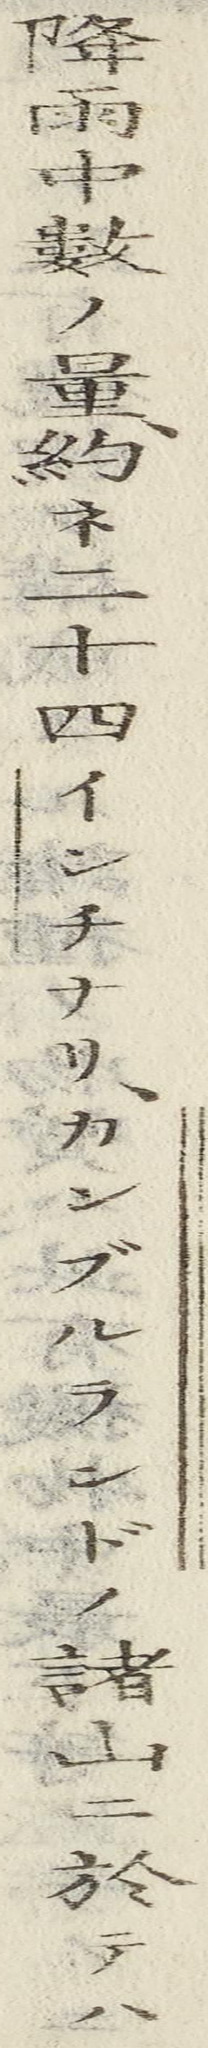降雨中数ノ量、約ネ二十四インチナリ、カンブルランドノ諸山ニ於テハ
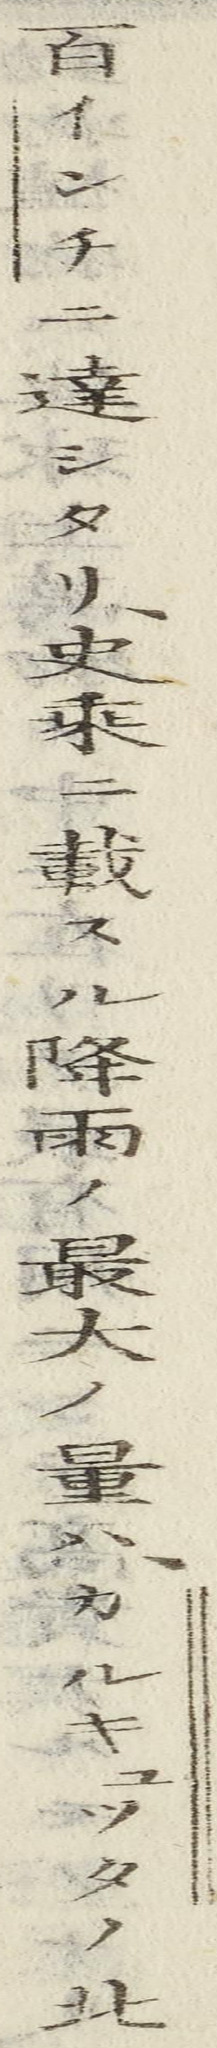百インチニ達シタリ、史乗ニ載スル降雨ノ最大ノ量ハ、カルキュツタノ北
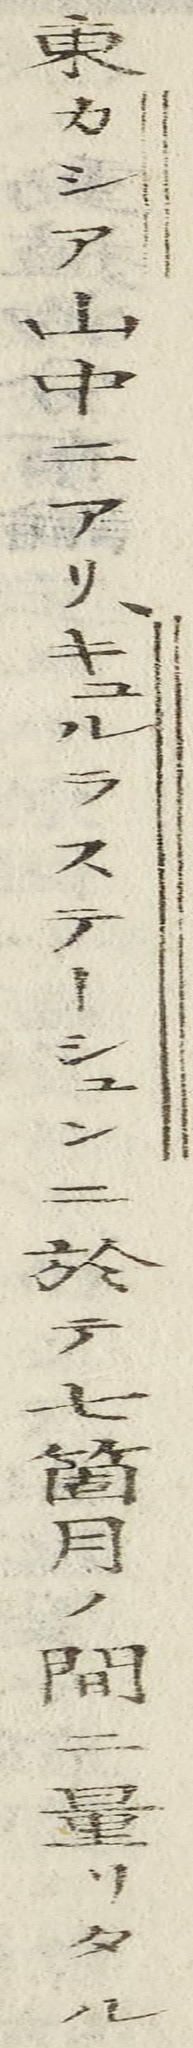東カシア山中ニアリ、キュルラステーシュンニ於テ七箇月ノ間ニ量リタル
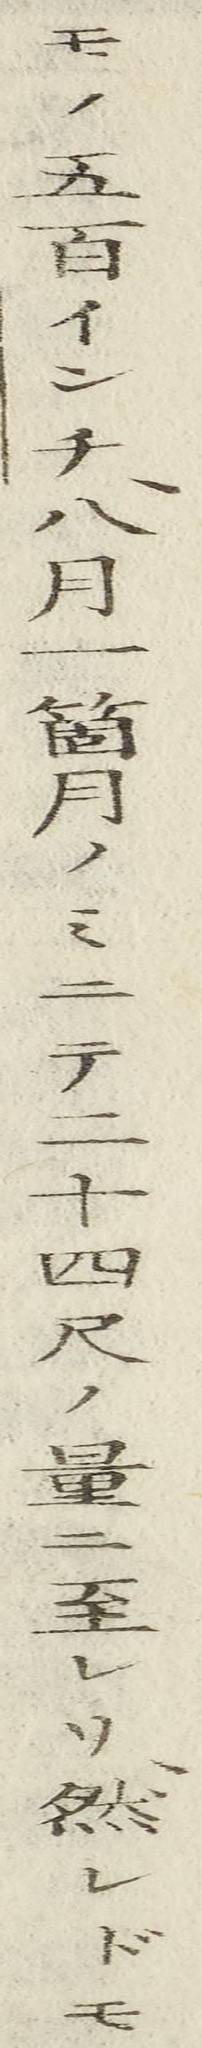モノ五百インチ、八月一箇月ノミニテ二十四尺ノ量ニ至レリ、然レドモ
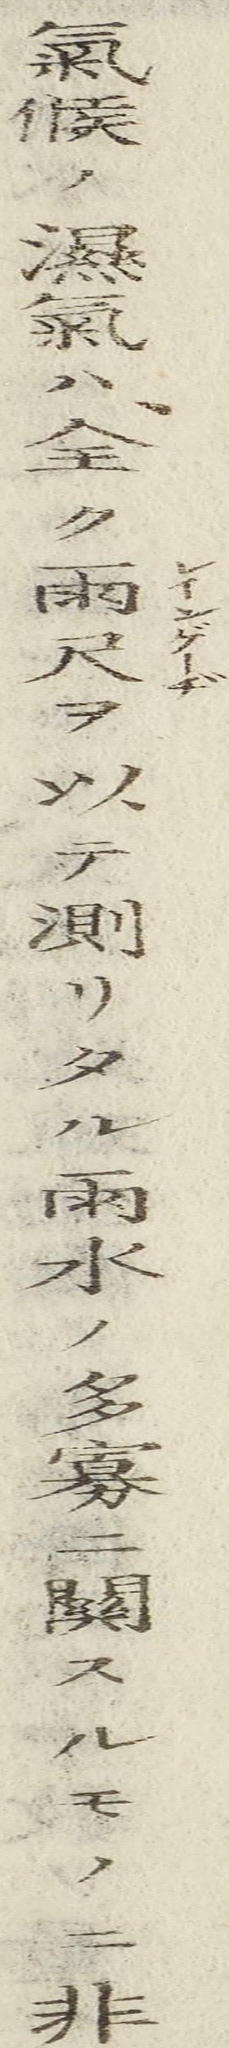気候ノ湿気ハ、全ク雨尺ヲ以テ測リタル雨水ノ多寡ニ関スルモノニ非
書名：百科全書　地文學　全
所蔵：東京大学地震研究所図書室 Earthquake Research Institute Library, The University of Tokyo, JAPAN
